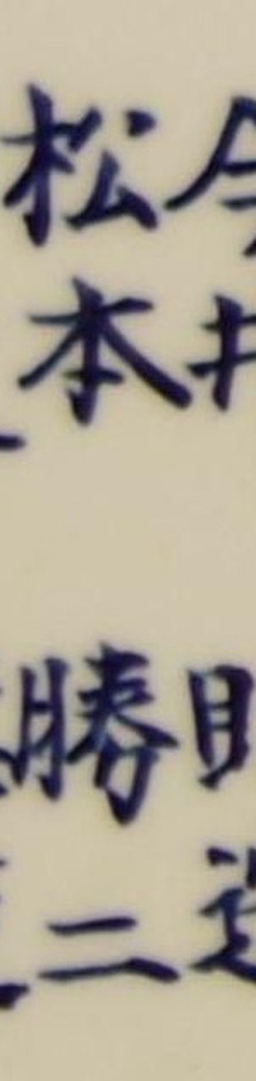松本勝二
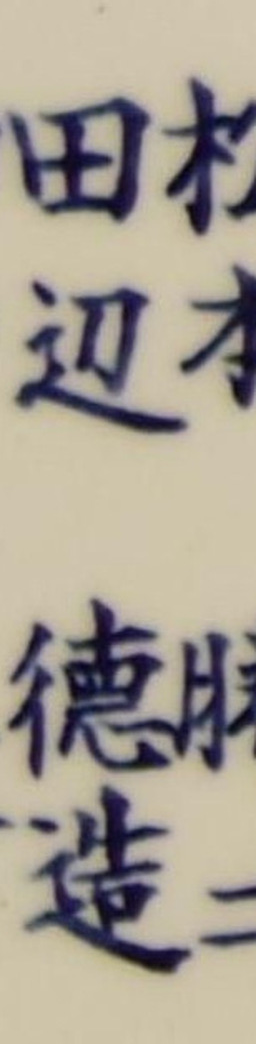田辺徳造
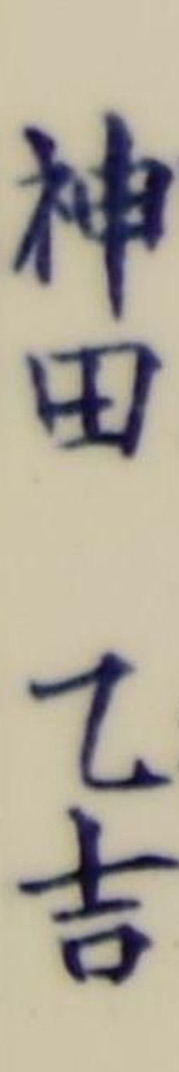神田乙吉

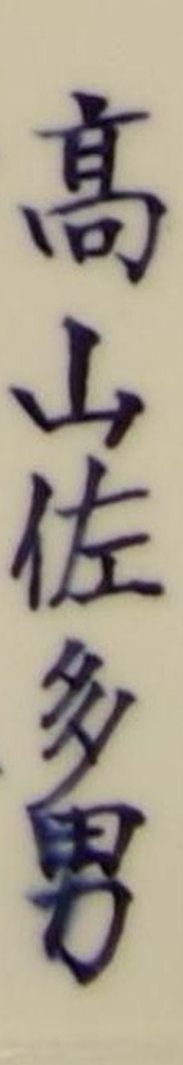高山佐多男
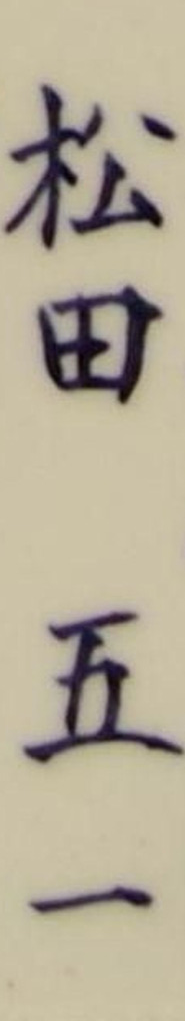松田五一
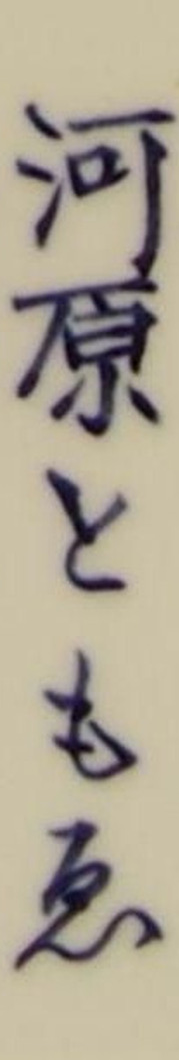河原ともゑ
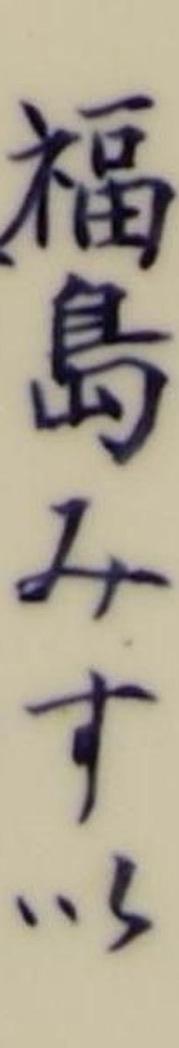福島みすい
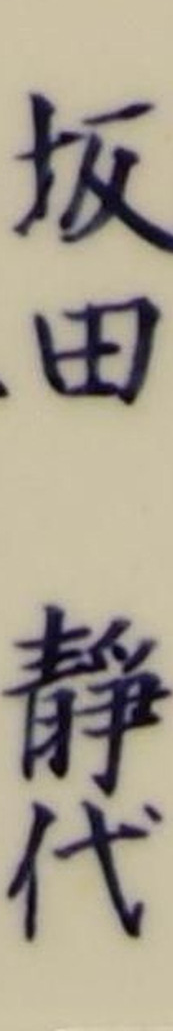坂田静代
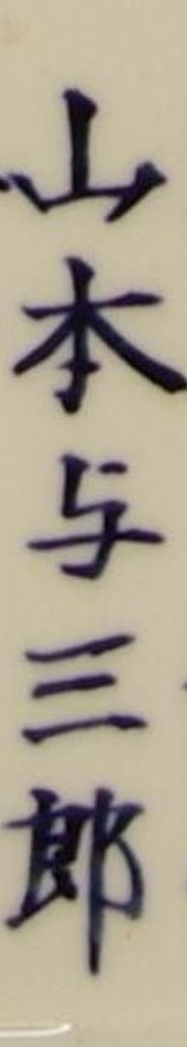山本与三郎
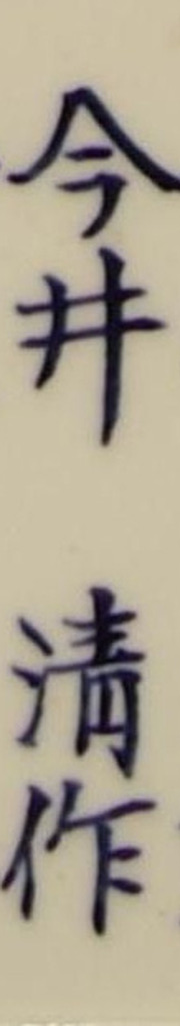今井清作
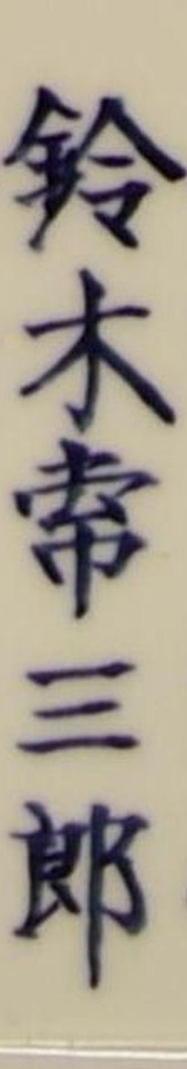鈴木常三郎
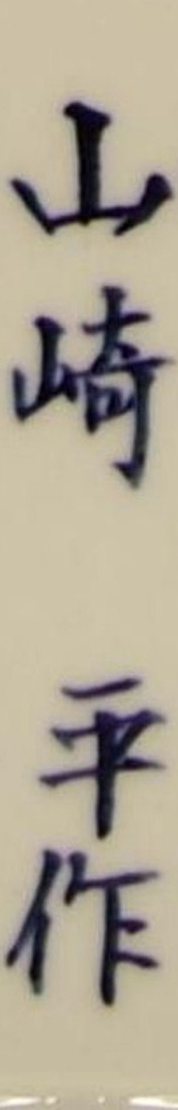山崎平作
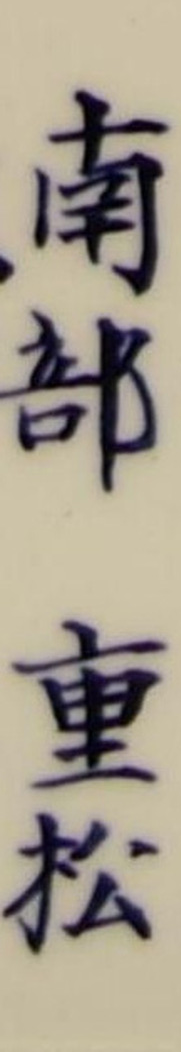南部重松
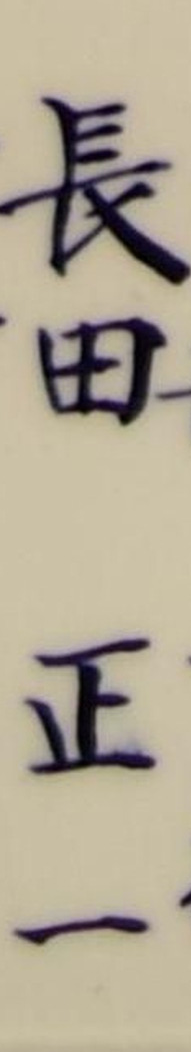長田正一
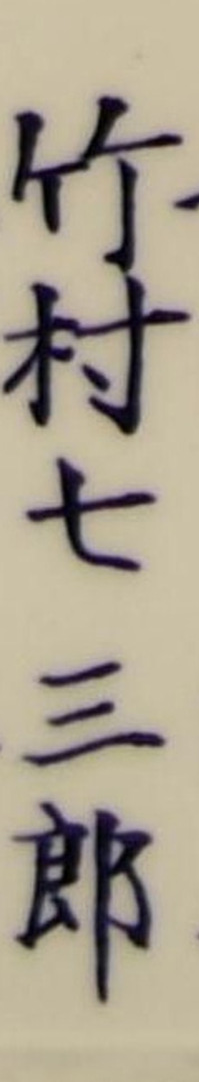竹村七三郎
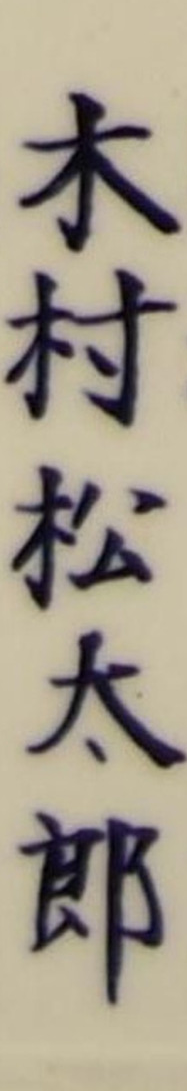木村松太郎
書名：A~D
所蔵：koyasan kongobuji
